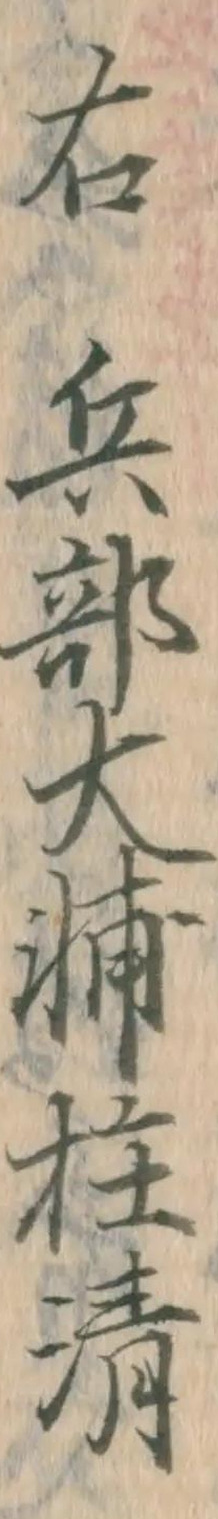右兵部大輔柱清
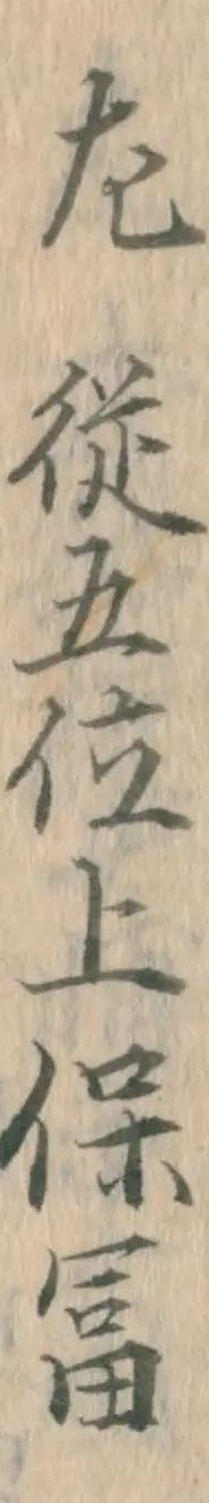左従五位上保冨
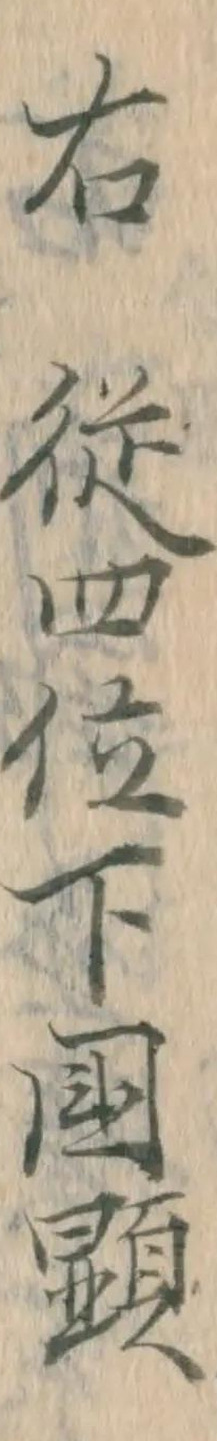右従四位下国顕
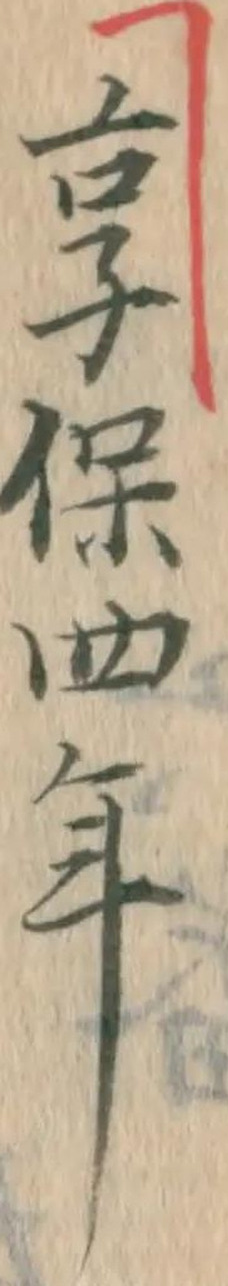享保四年
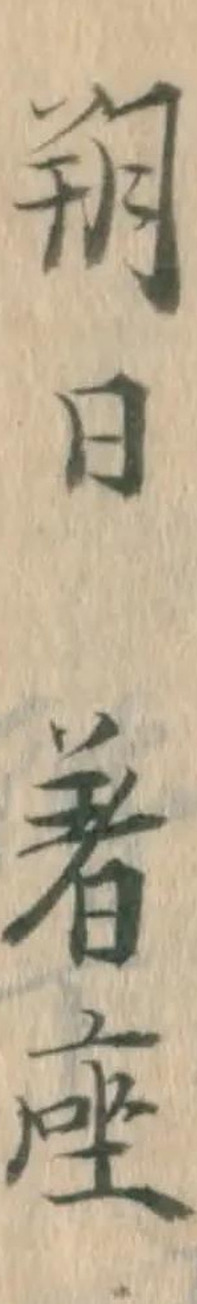朔日着座
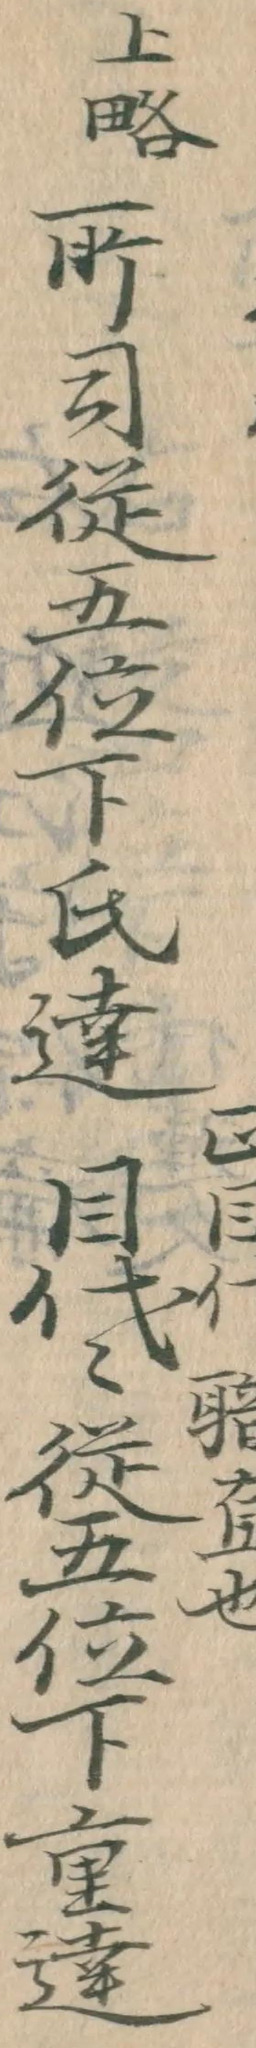上略所司従五位下氏達目代々従五位下重達
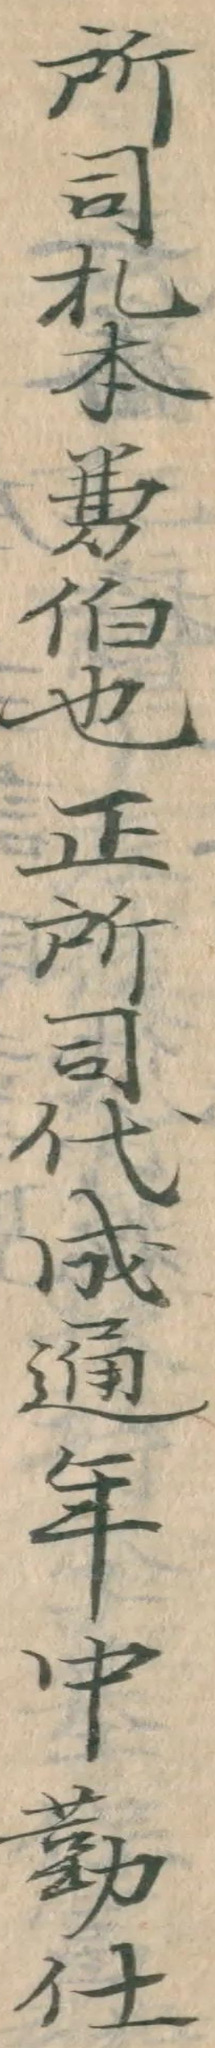所司札本兼伯也正所司代成通年中勤仕
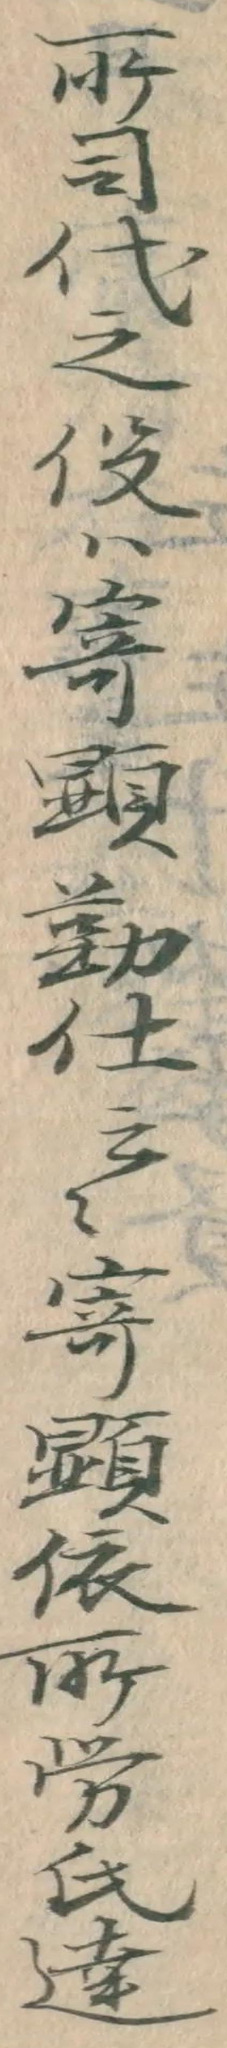所司代之役ハ寄顕勤仕云々寄顕依所労氏達
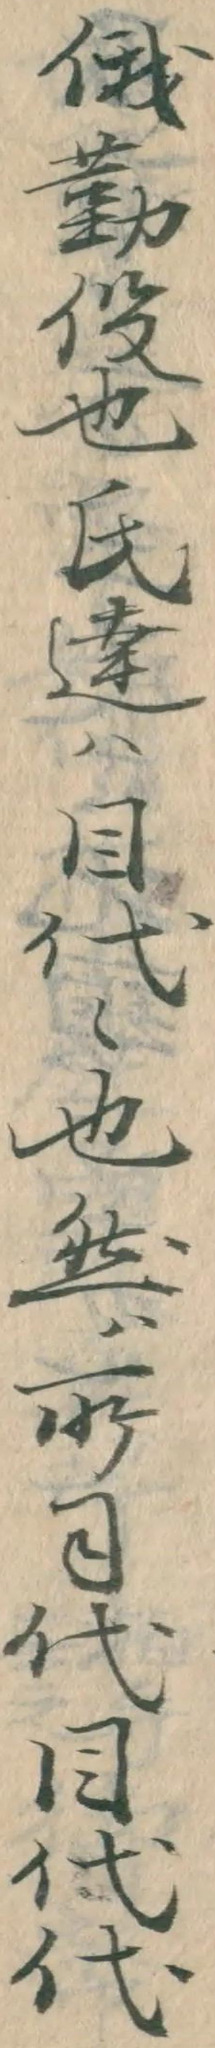俄勤役也氏達ハ目代々也然ハ所司代目代代代
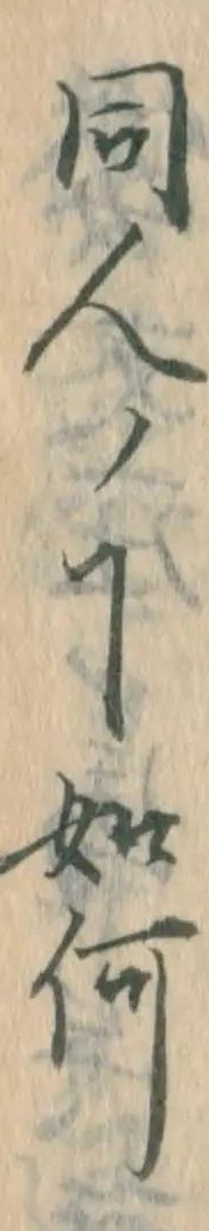同人ノコト如何

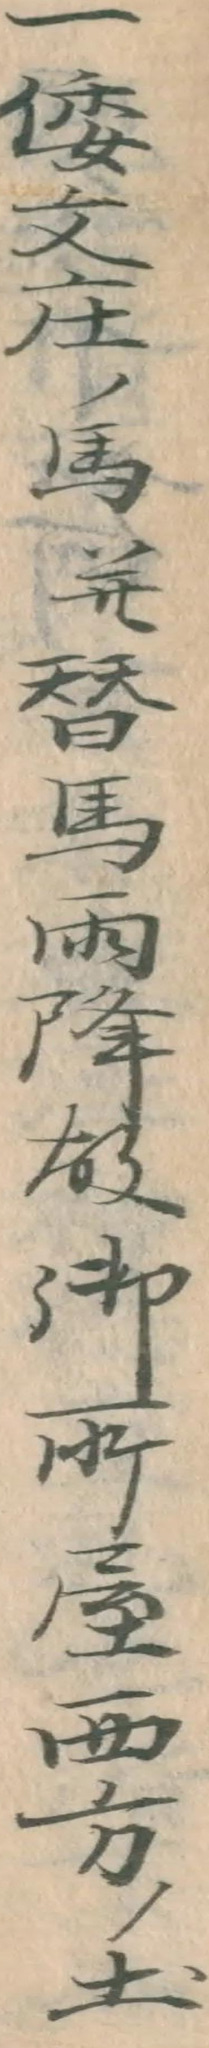一倭文庄ノ馬并替馬雨降故御所屋西方ノ土
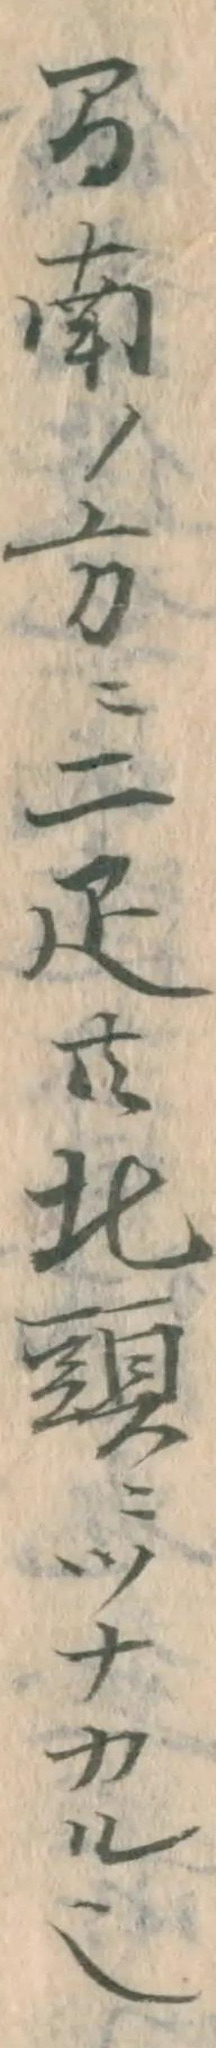間南ノ方ニ二疋共北頭ニツナカル也
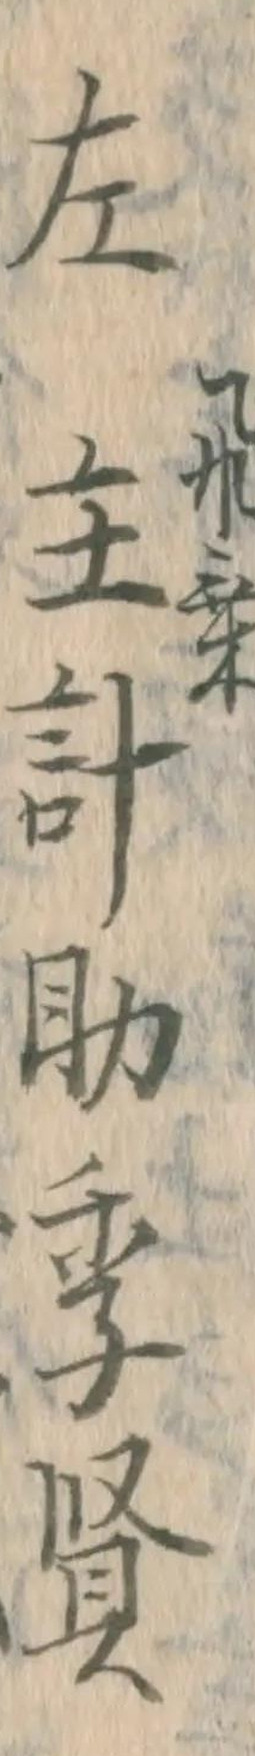左主計助季賢
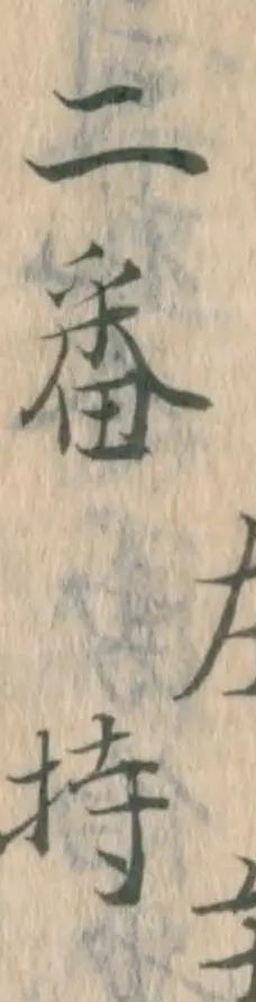二番持
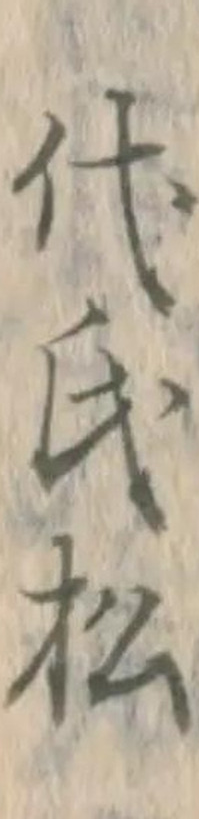代氏松
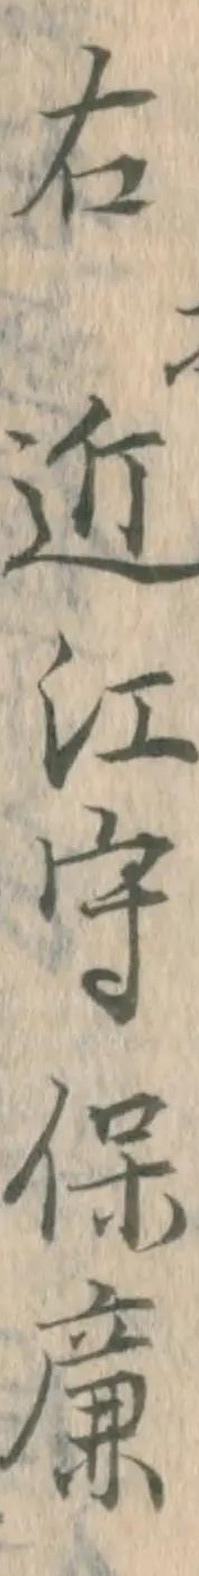右近江守保廉
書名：賀茂社記録. 第10冊
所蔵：国立国会図書館 National Diet Library, JAPAN
